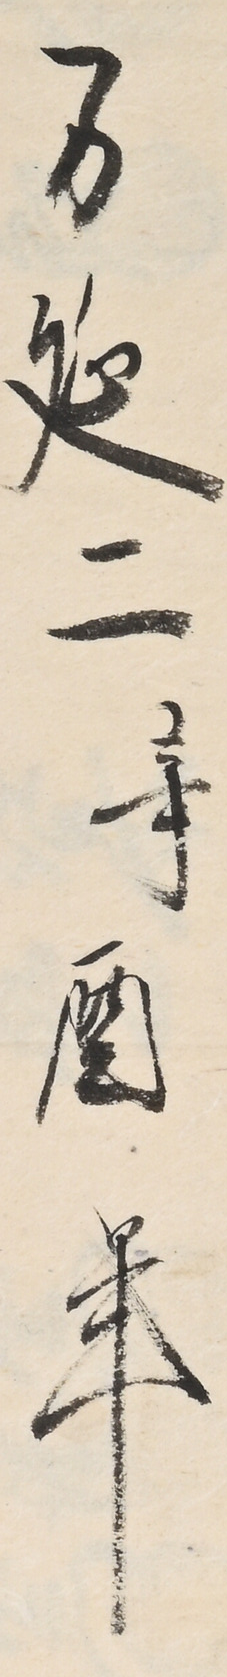万延二辛酉年
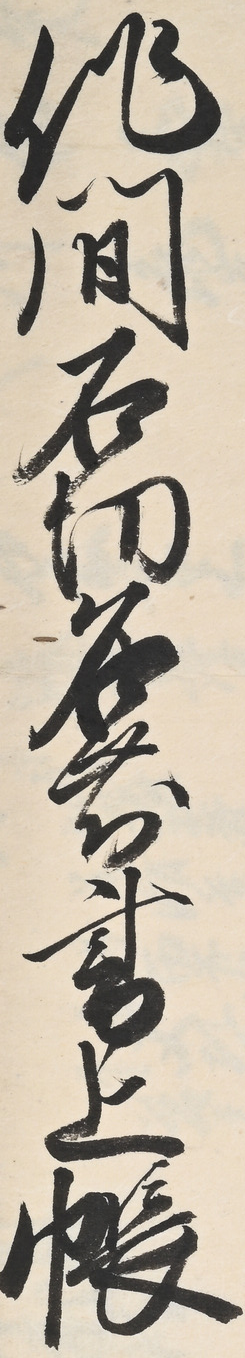作間石切名前書上帳
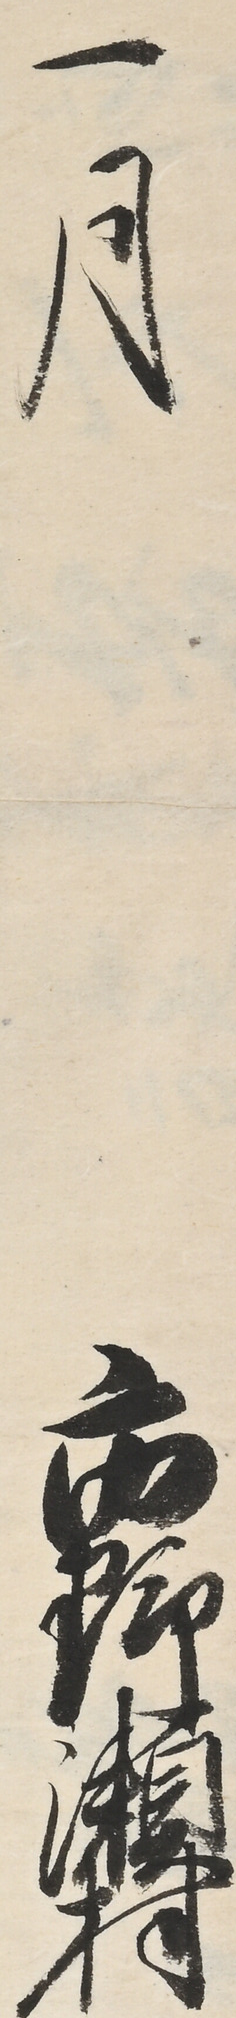二月市野瀬村

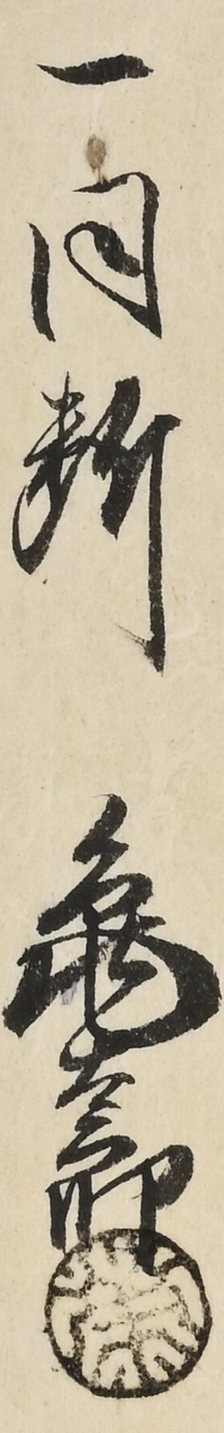一同断亀太郎㊞
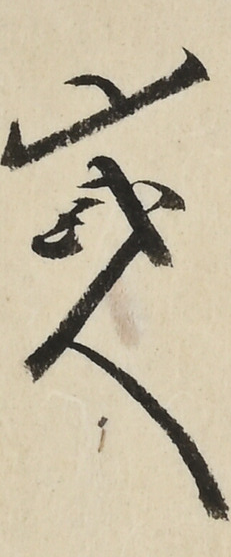〆弐人

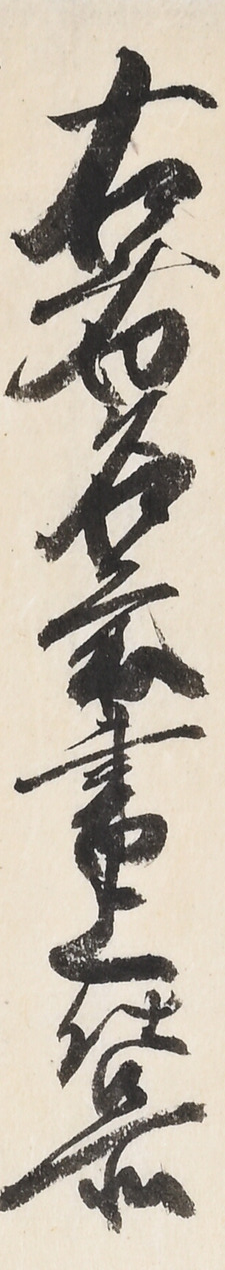右者名前書上仕候所
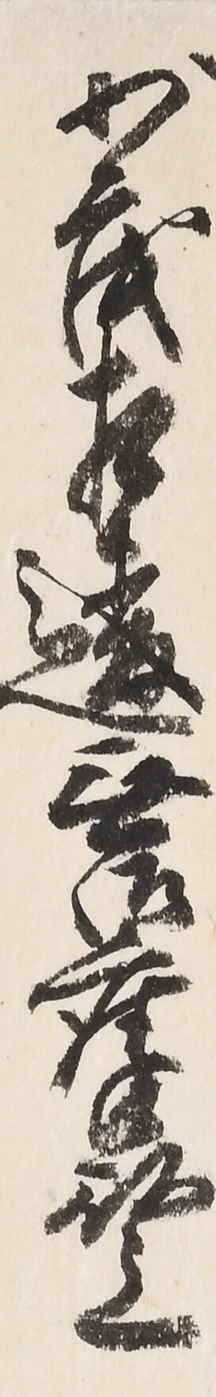少茂相違無御座候以上
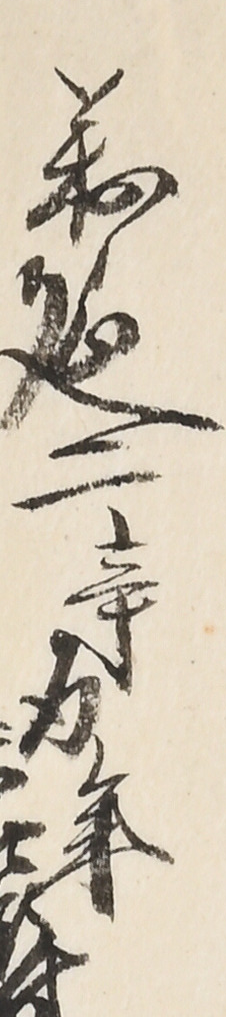万延二辛酉年
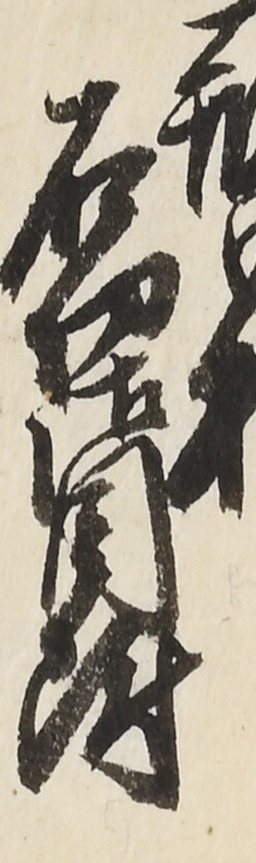石切御目附
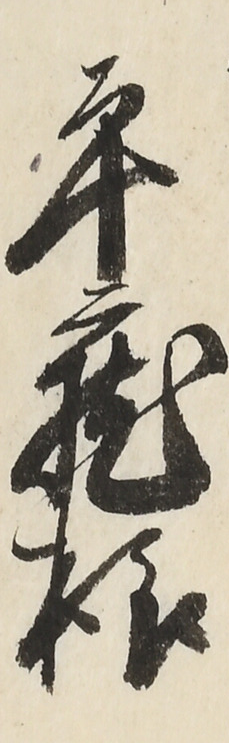平蔵様
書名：万延二辛酉年二月作間石切名前書上帳
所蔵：伊那市立高遠町図書館・合同会社AMANE
